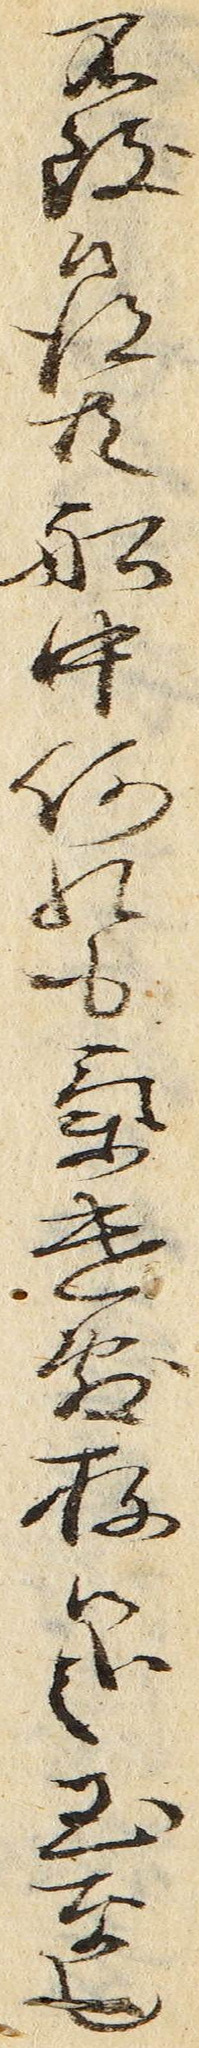不致候得共船中何れも気遣敷存候哉玉なし
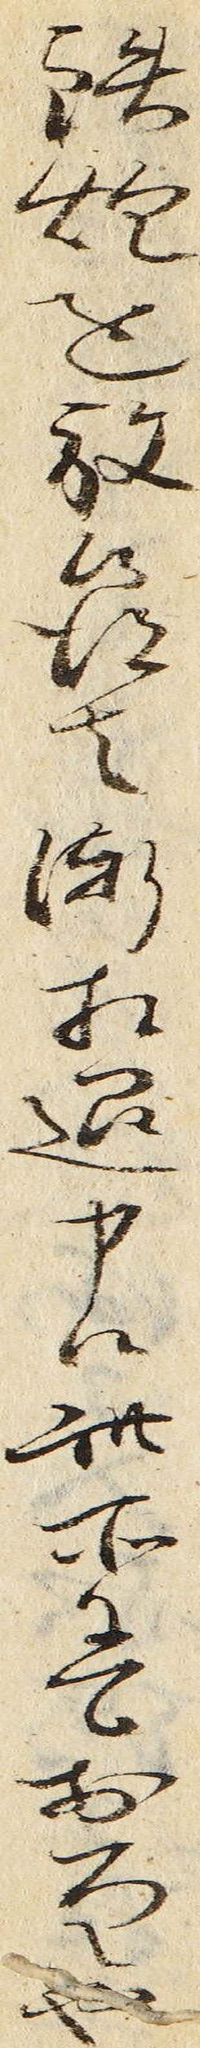鉄炮を放候得は漸相退申候此所にておろしや
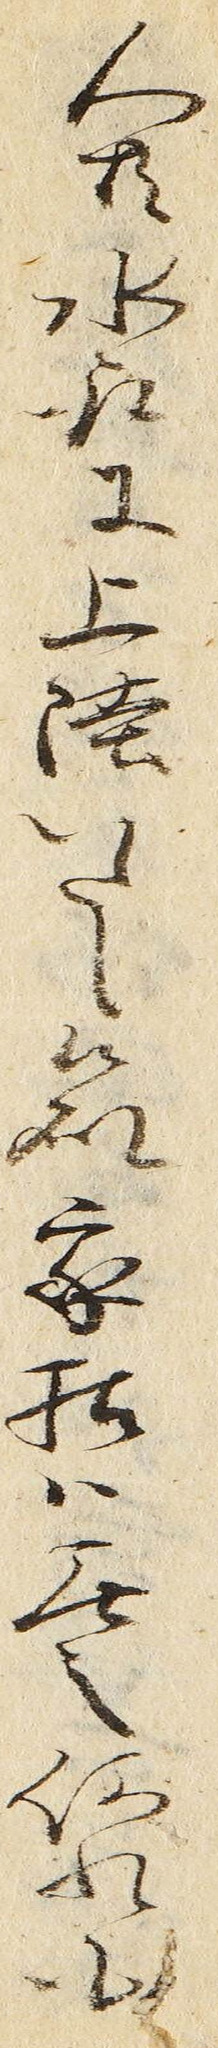人共水取に上陸いたし候処家居は無之何れも
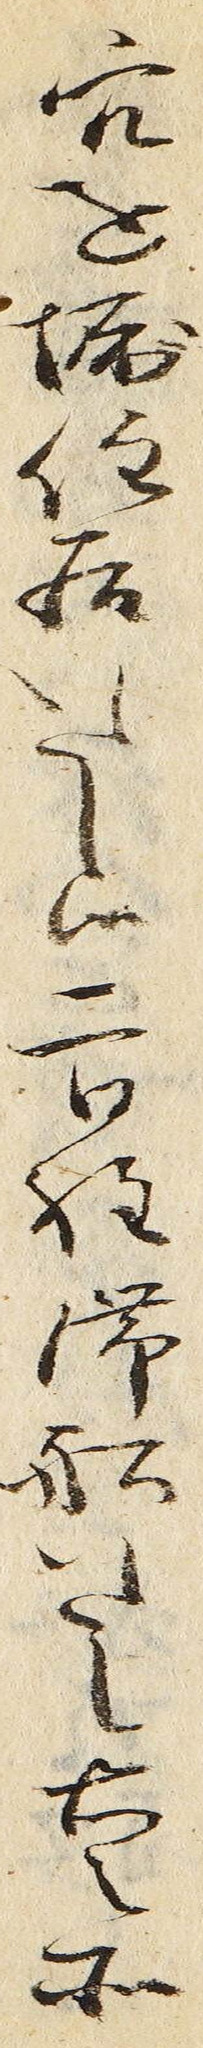穴を掘住居いたし候二日程滞船いたし右之所
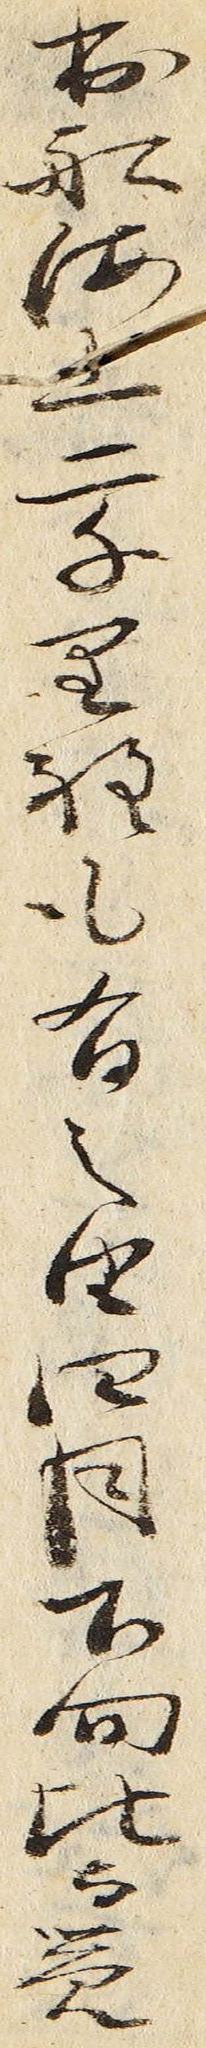出船海上二千里程も有之由四月下旬比と覚
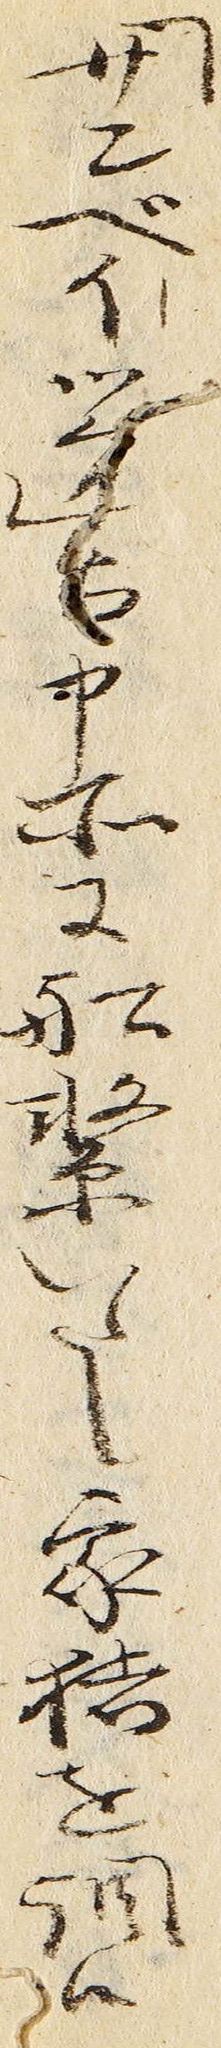「サンベイツク」と申所に船繋いたし家猪を調候
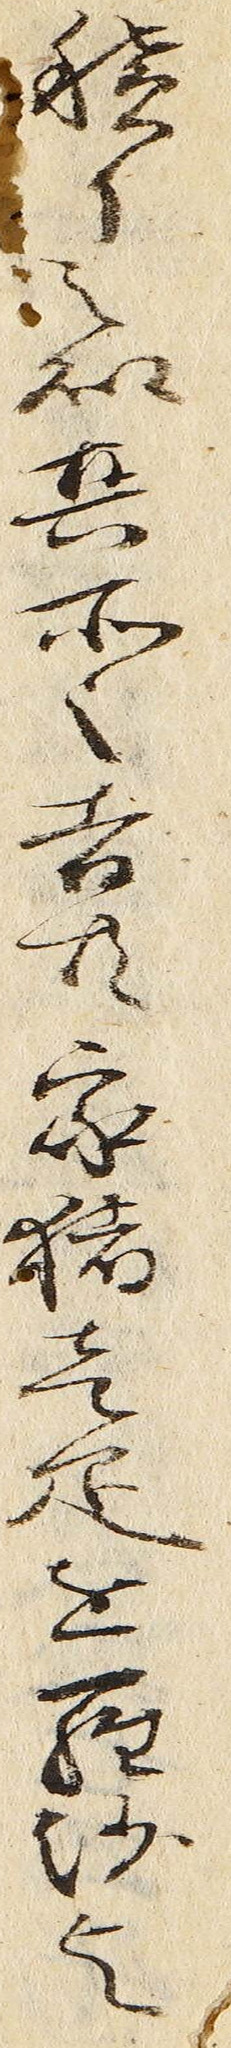積り之処其所之者共家猪壱疋を羅紗と
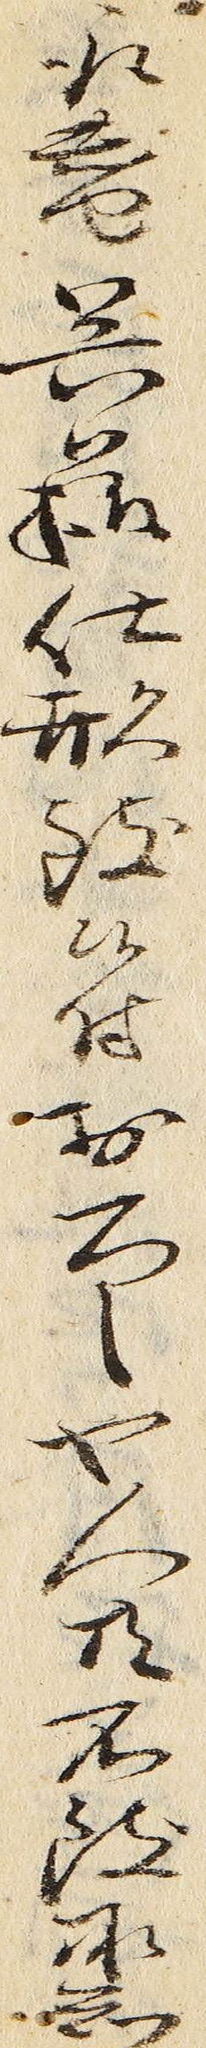取替呉候様仕形致候付おろしや人共不致承知
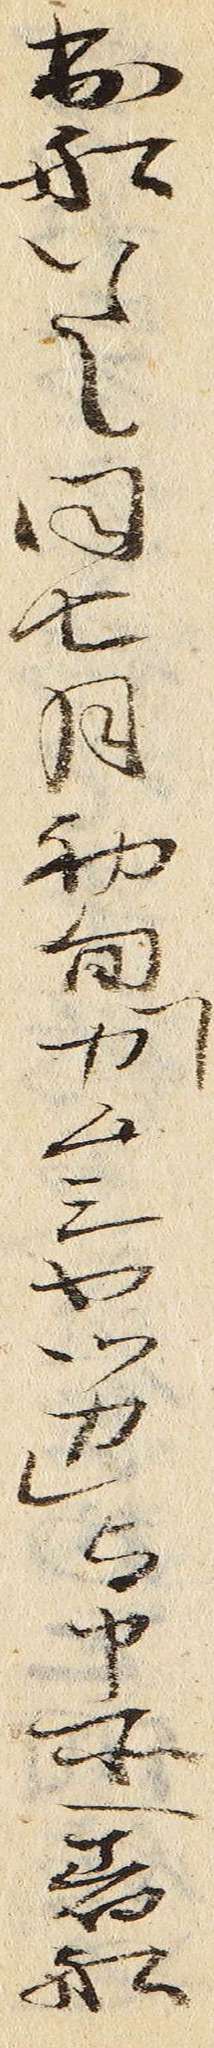出船いたし同七月初旬「カムシヤツカ」と申所へ着船
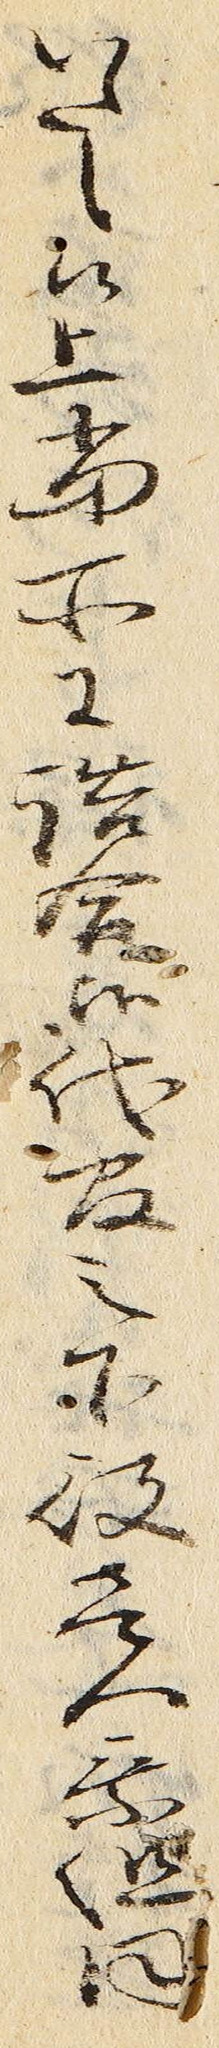いたし候上当所に詰合候代官之下役壱人乗組同
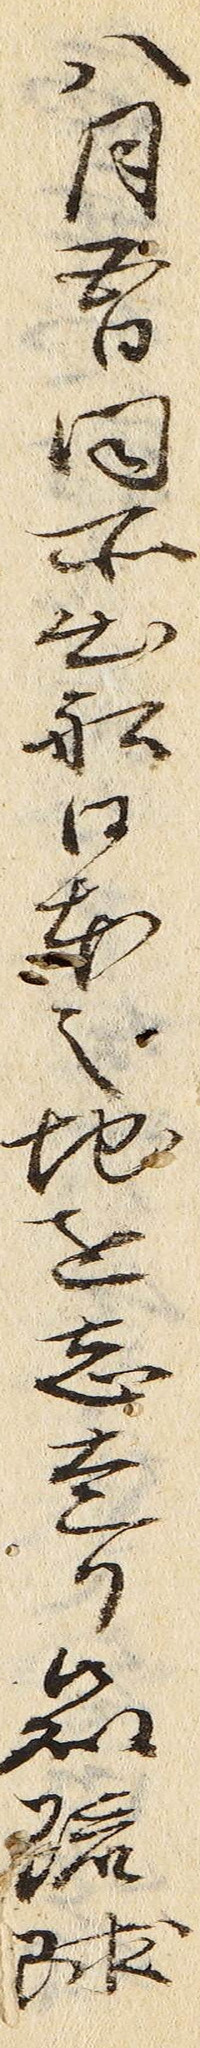八月五日同所出船日本之地を志走り候処琉球
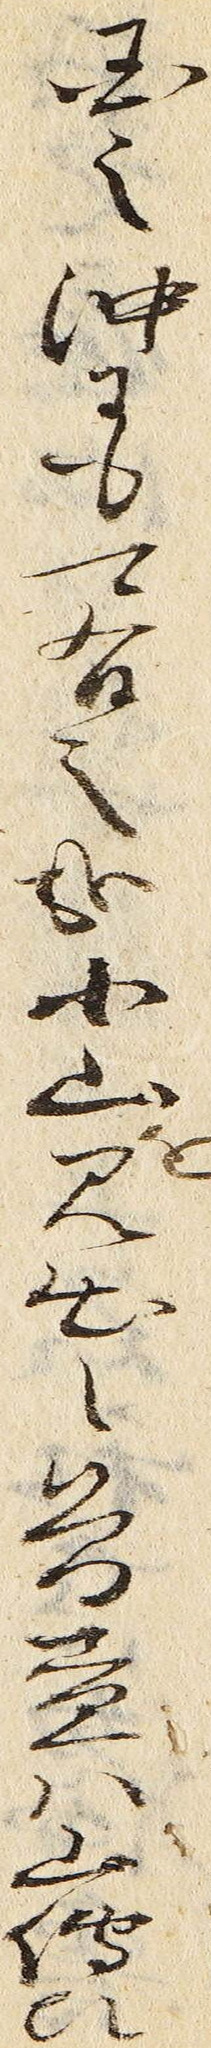国之沖にも可有之哉小山見出し候間昼は山伝ひ
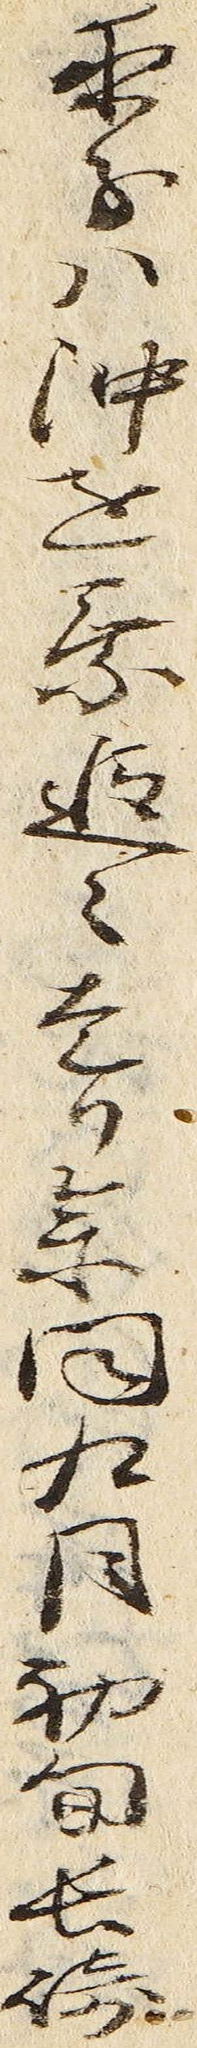夜分は沖を乗追々走り参同九月初旬長崎
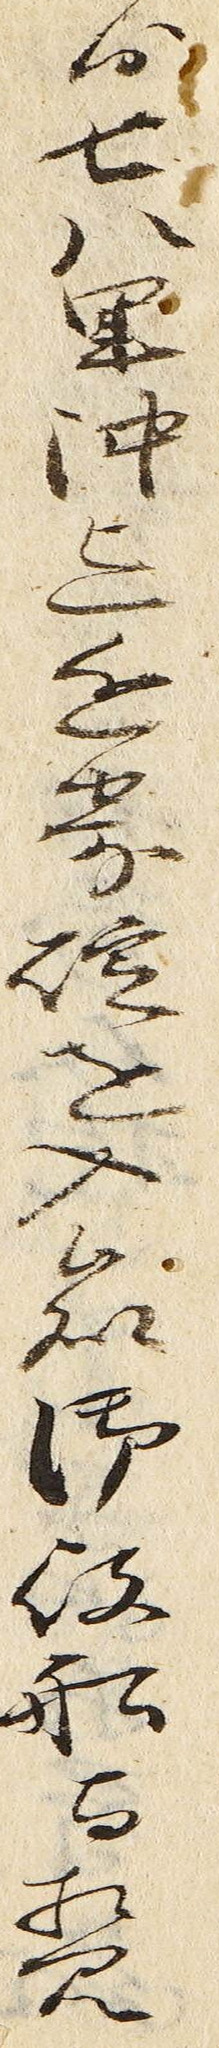ゟ七八里沖迄近寄碇を入候処御役船と相見
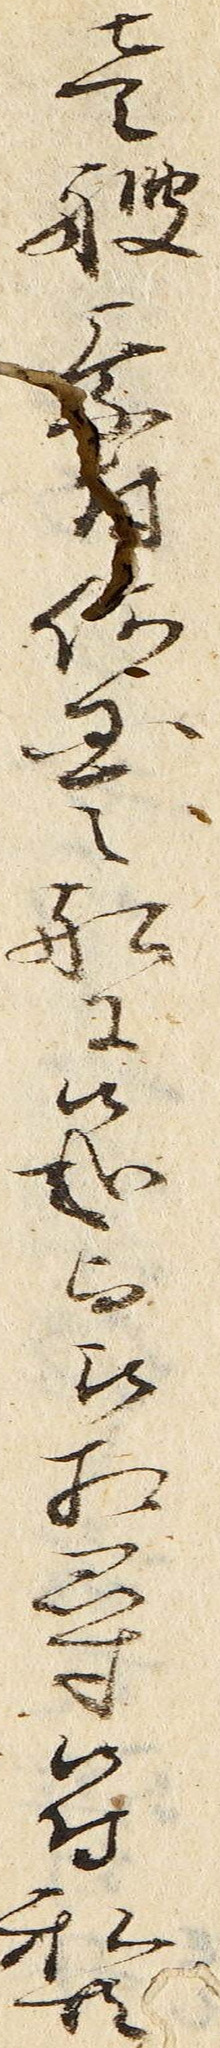壱艘乗付何国之船に候哉と被相尋候付私共
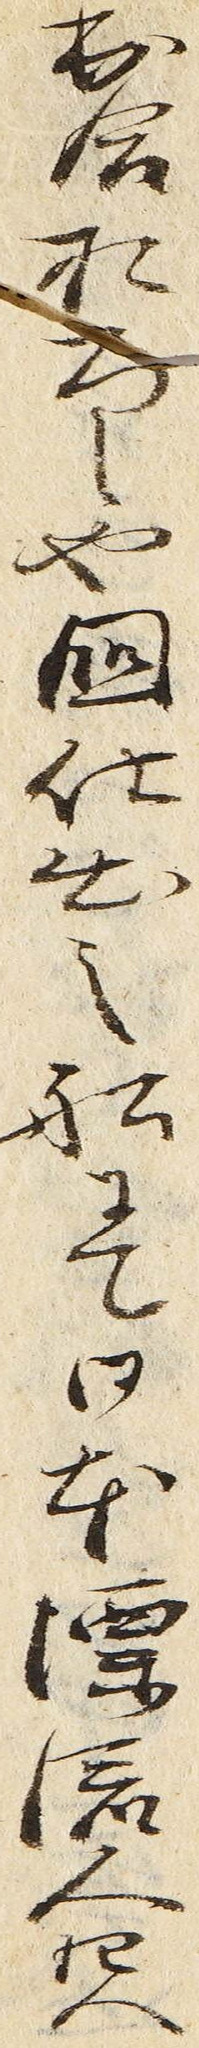出合おろしや国仕出之船にて日本漂流人四人
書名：漂民後記
